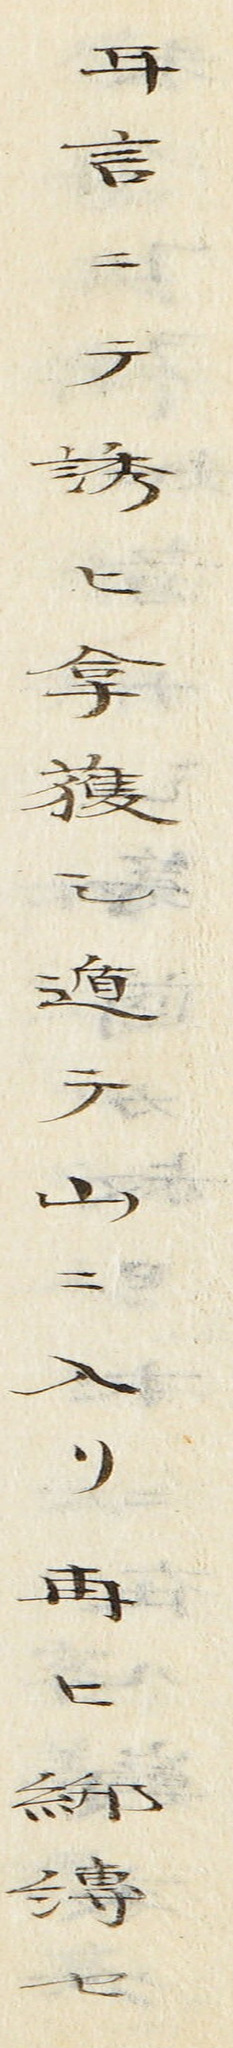耳言ニテ誘ヒ拿獲シ遁テ山ニ入リ再ヒ綁縛セ
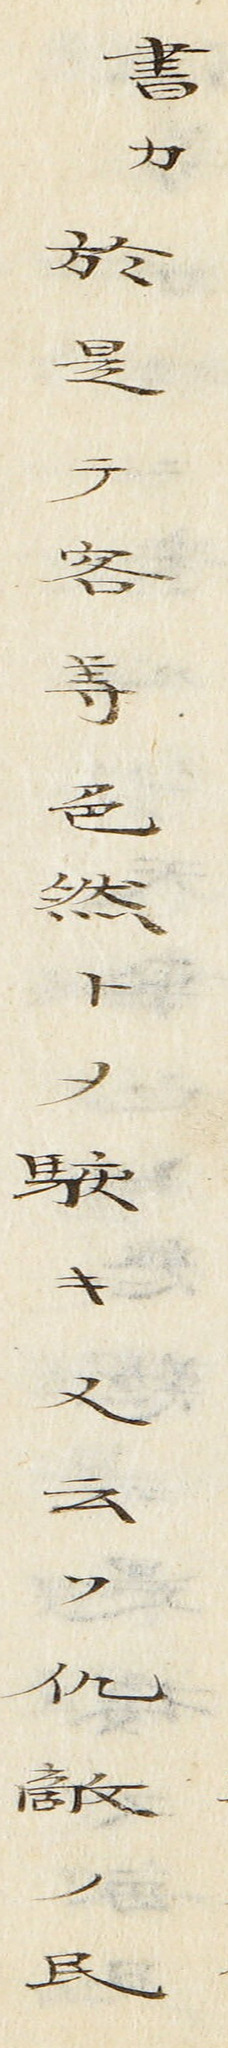書カ於是テ客等色然トシテ駭キ又云フ仇敵ノ民
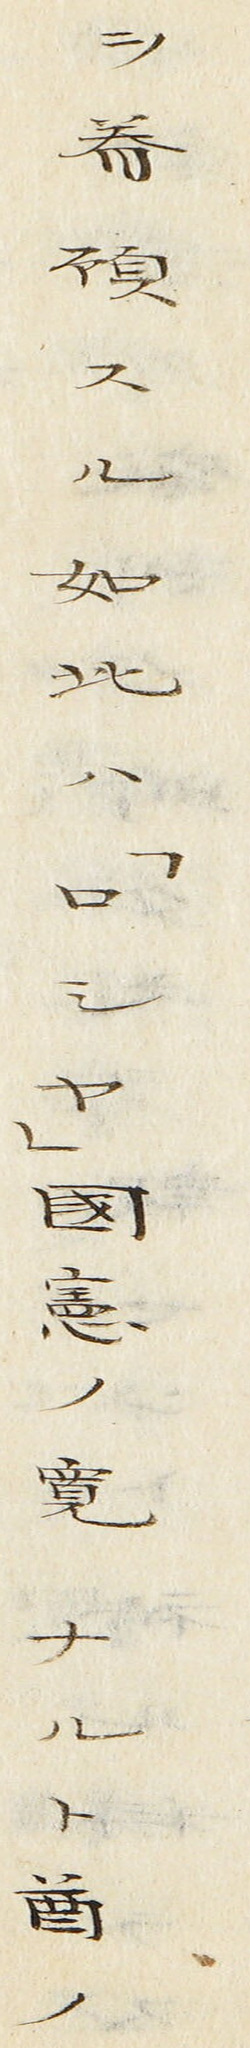ヲ眷領スル如此ハ「ロシヤ」国憲ノ寛ナルト酋ノ
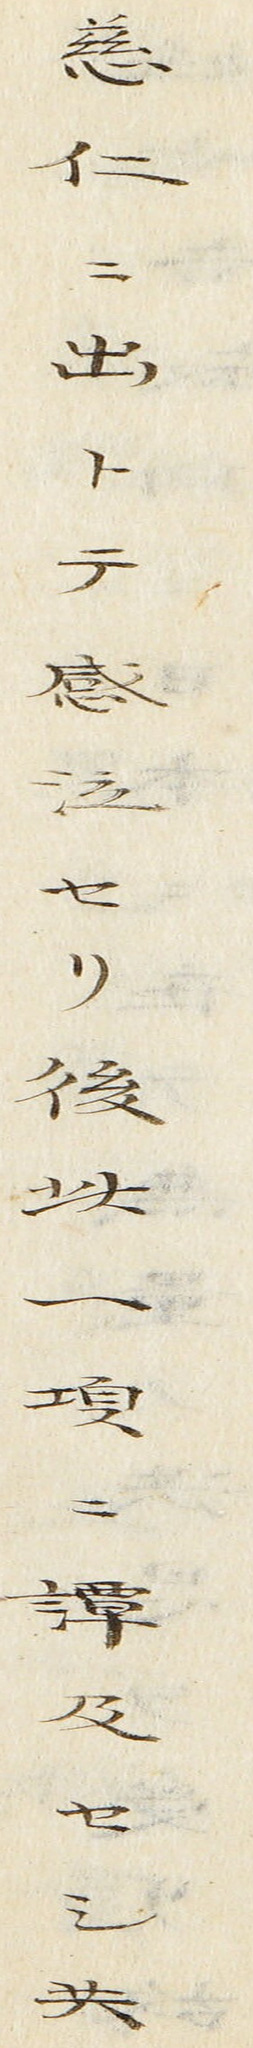慈仁ニ出トテ感泣セリ後此一項ニ譚及セシ共
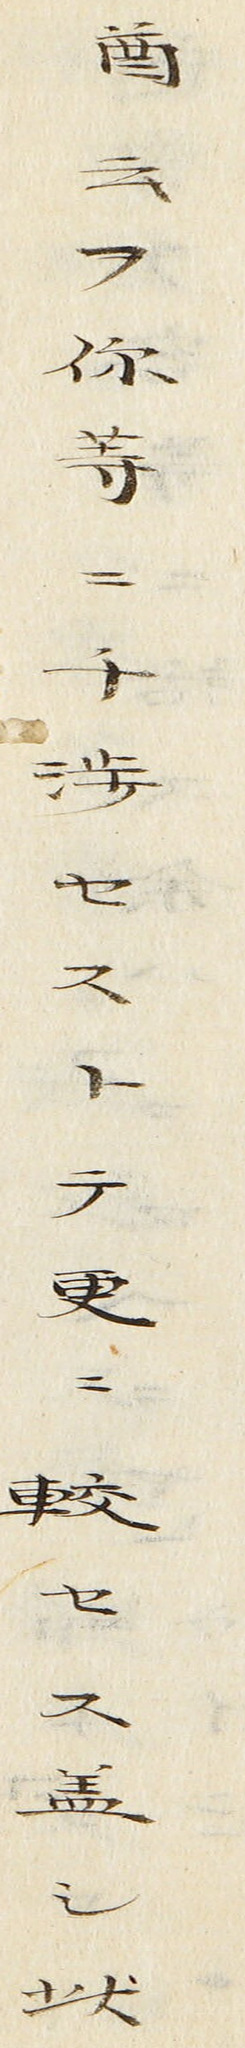酋云フ你等ニ干渉セストテ更ニ較セス蓋シ此
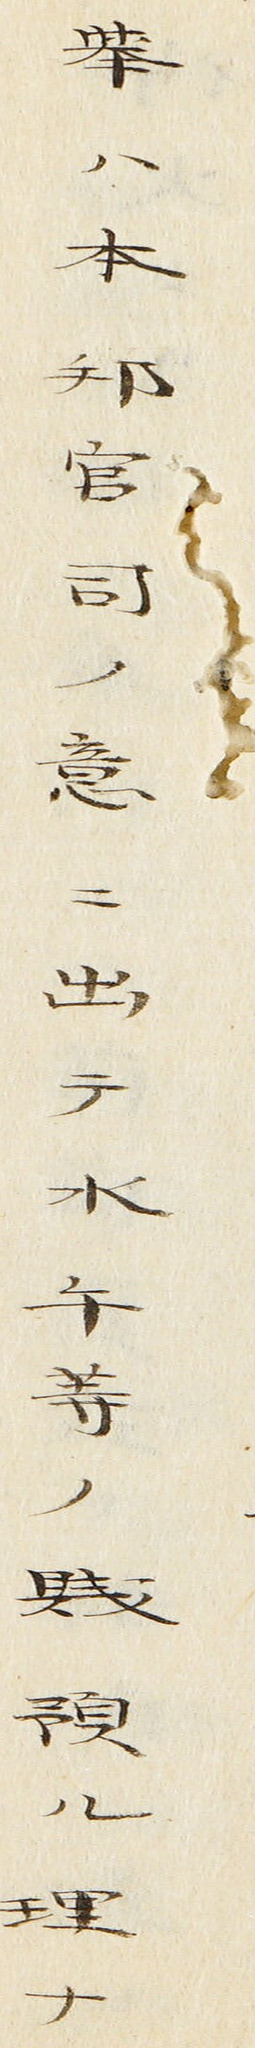挙ハ本邦官司ノ意ニ出テ水午等ノ賎預ル理ナ
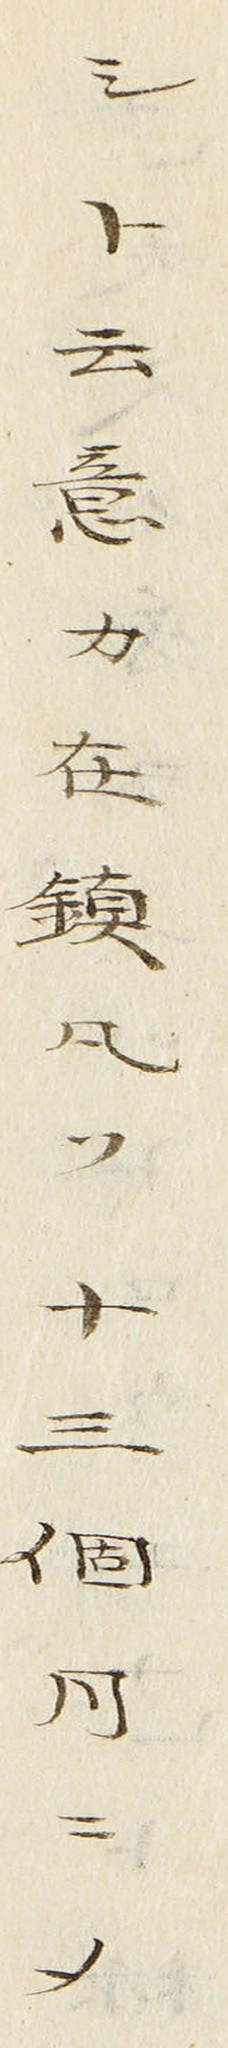シト云意カ在鎮凡ソ十三個月ニシテ
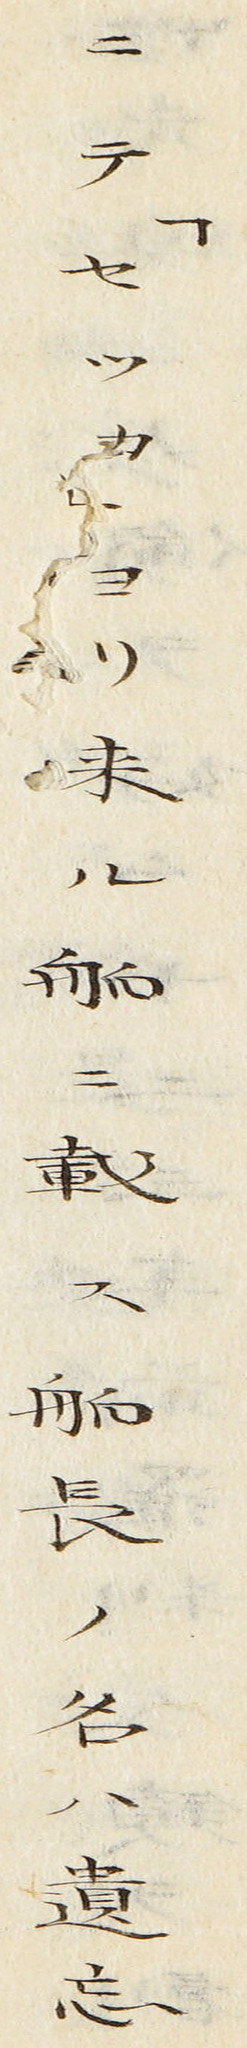ニテ「セツカ」ヨリ来ル舶ニ載ス舶長ノ名ハ遺忘
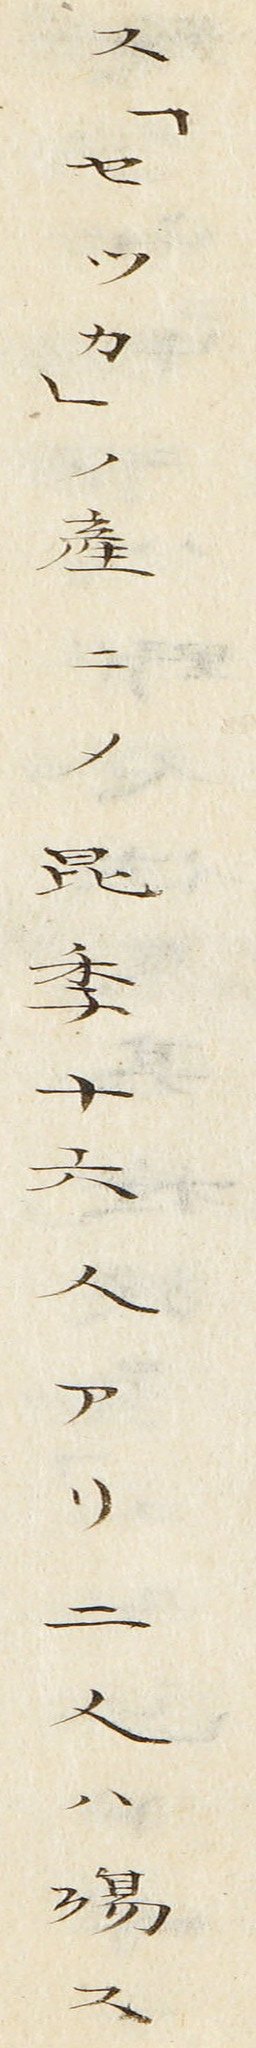ス「セツカ」ノ産ニシテ昆季十六人アリ二人ハ殤？ス
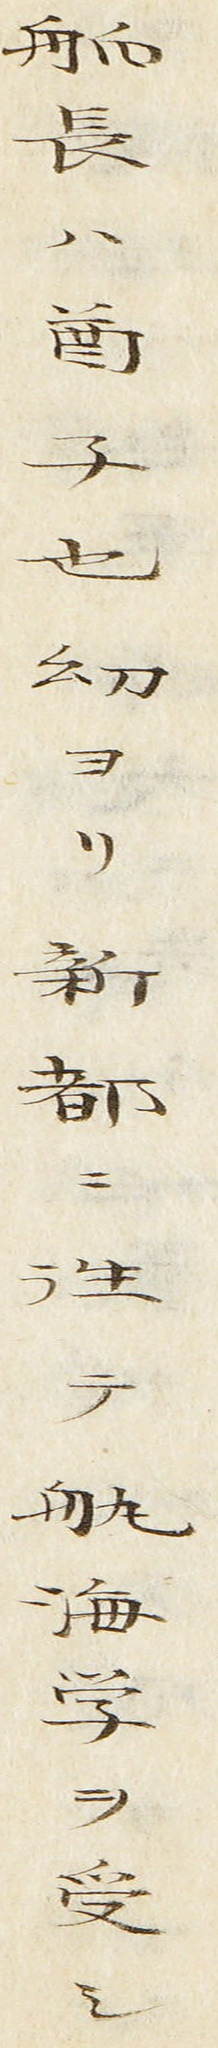舶長ハ酋子也幼ヨリ清と新都ニ往テ航海学ヲ受シ
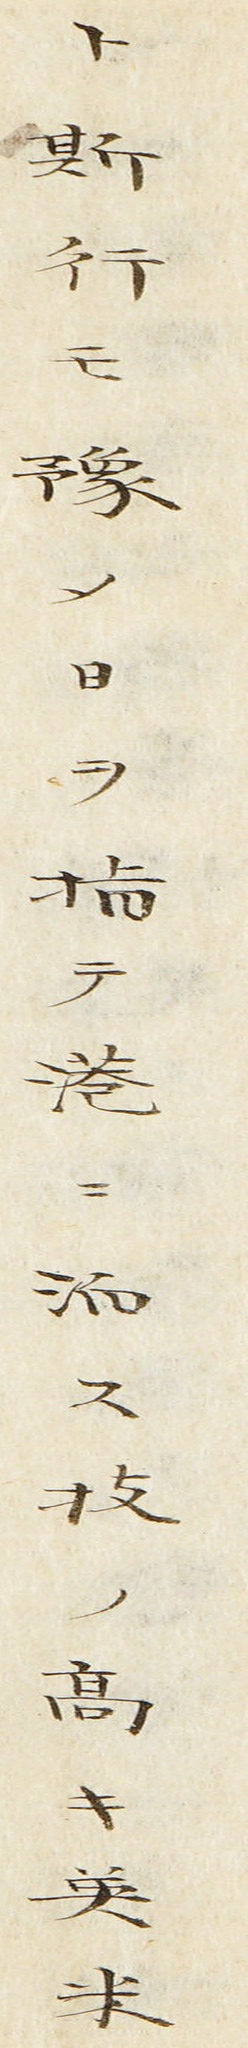ト斯行モ予シテ日ヲ指テ港ニ泊ス技ノ高キ英米
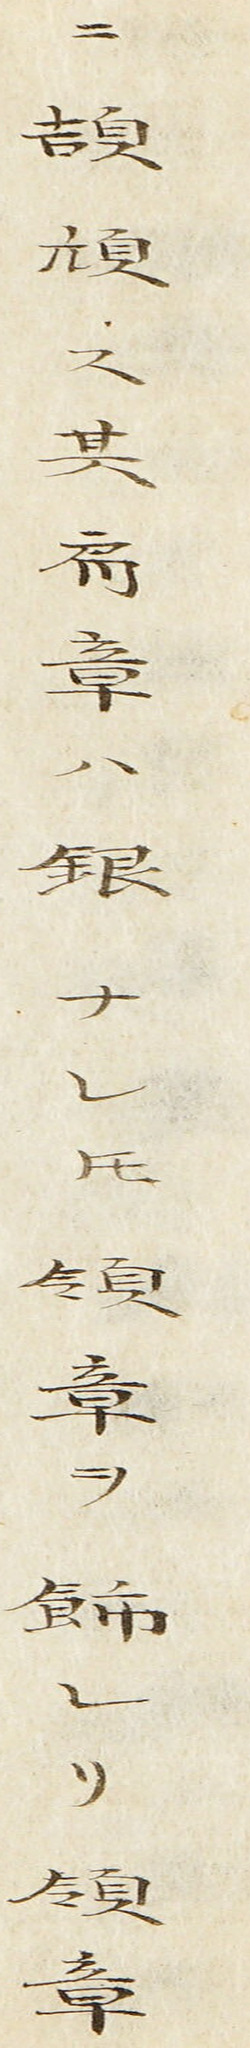ニ頡頑ス其肩章ハ銀ナレドモ領章ヲ飾レリ領章
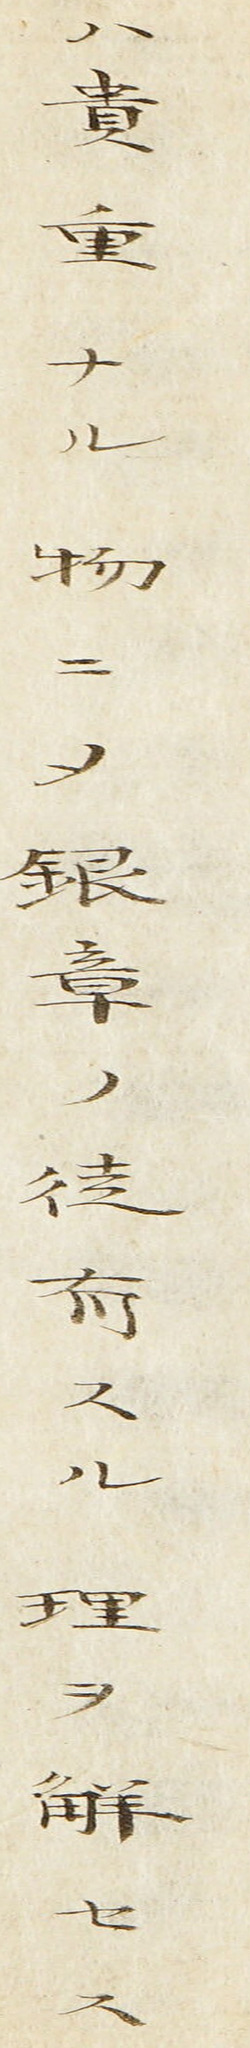ハ貴重ナル物ニシテ銀章ノ徒有スル理ヲ解セス
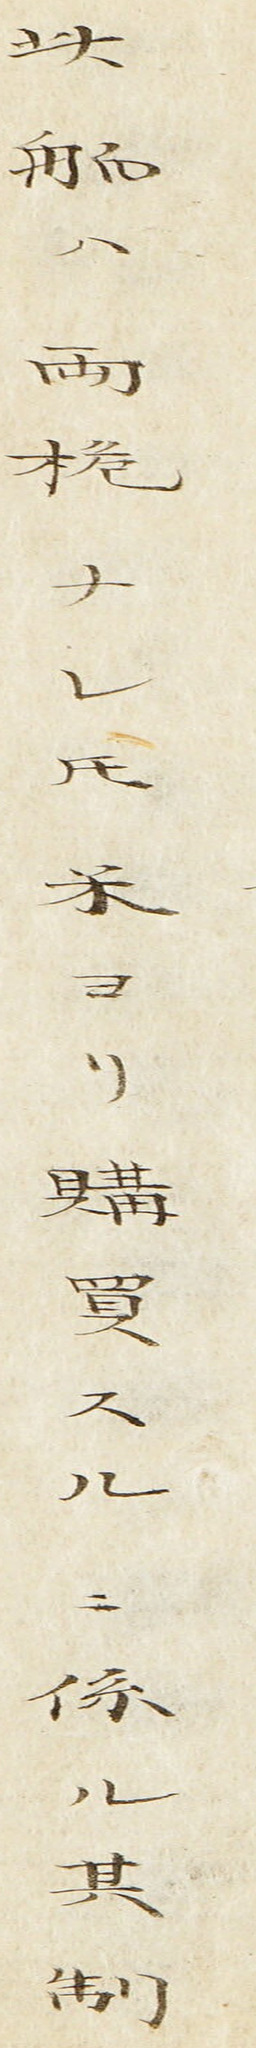此舶ハ両桅ナレドモ米ヨリ購買スルニ係ル其制
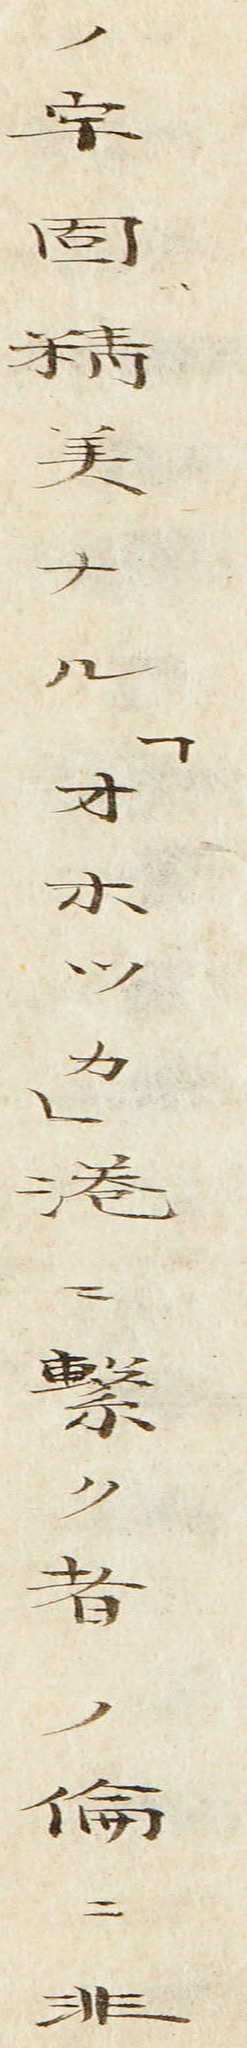ノ牢固精美ナル「オホツカ」港ニ繋ク者ノ倫ニ非
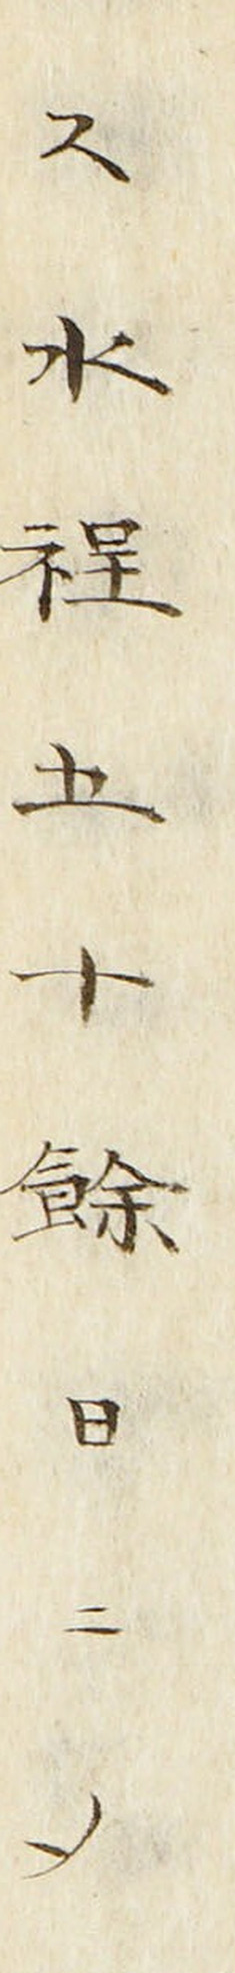ス水程五十余日ニシテ
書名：蕃談
